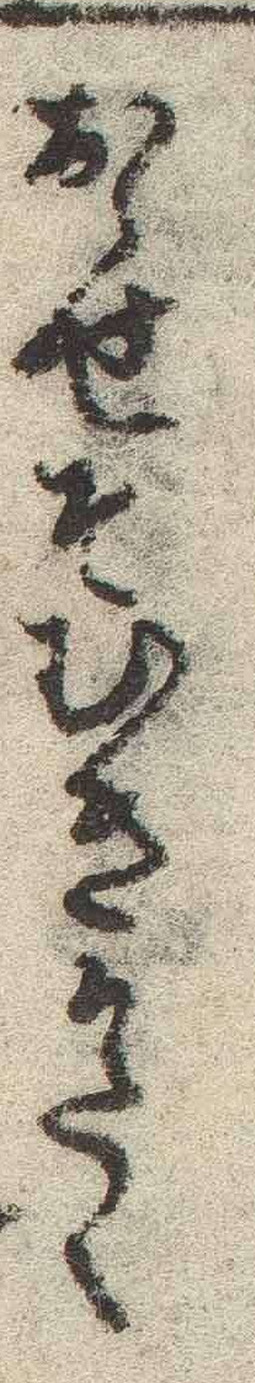おゝせそむきかたく
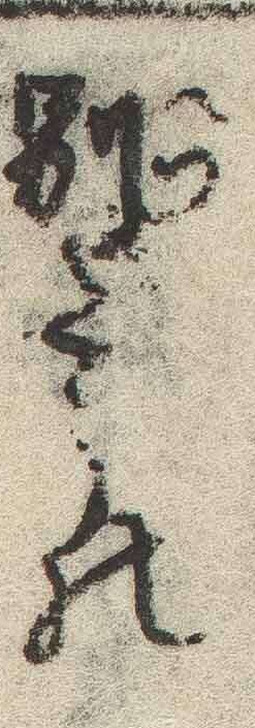別たうの
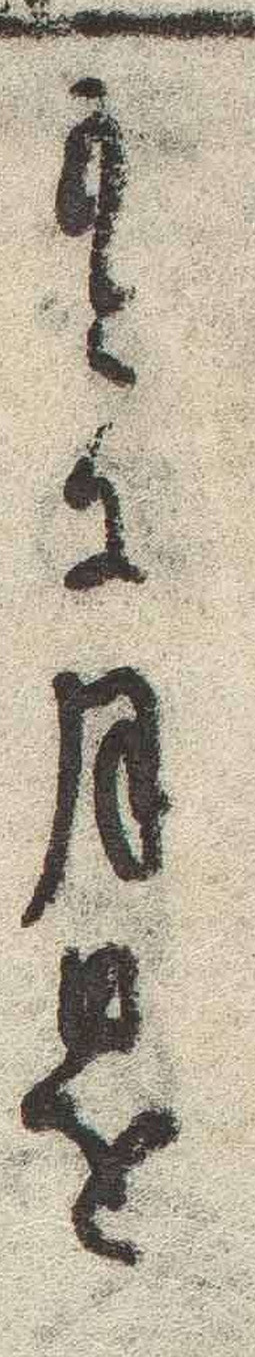もとに月日を
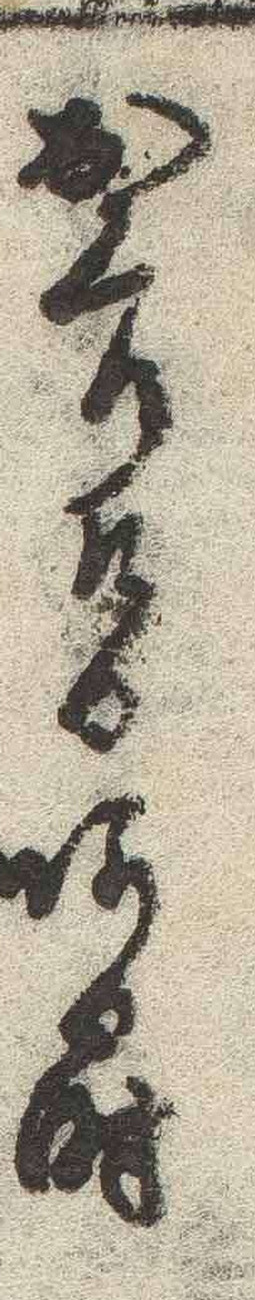おくりけるある時
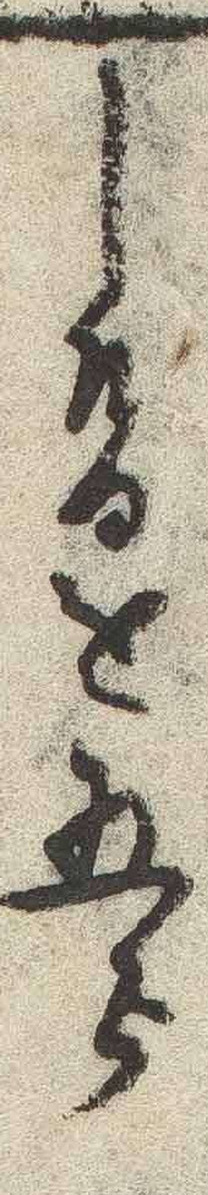しけるを五郎
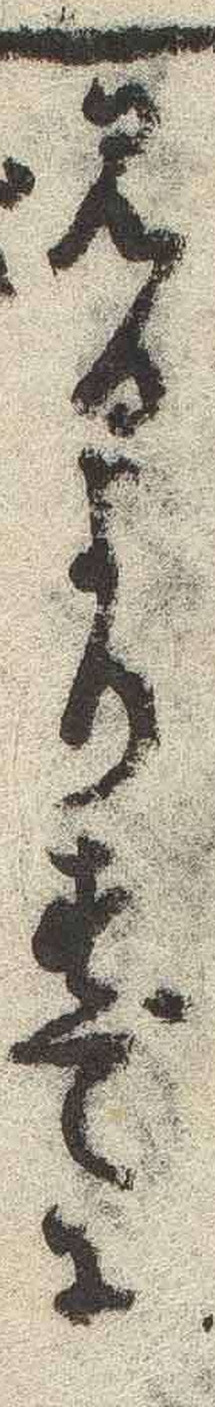見るよりすでに
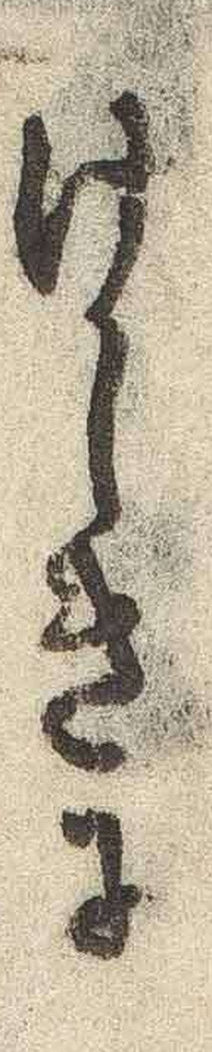けしきに
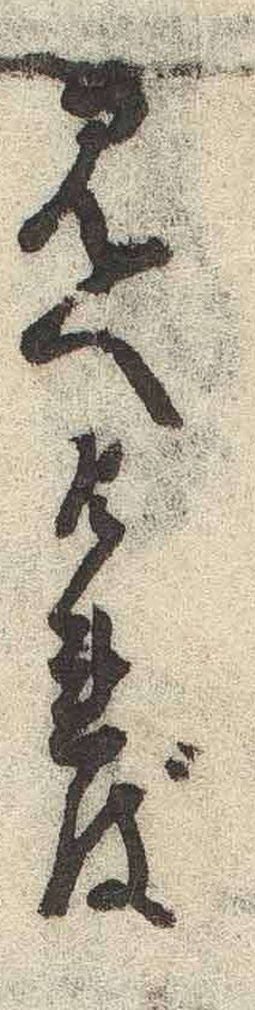見へければ
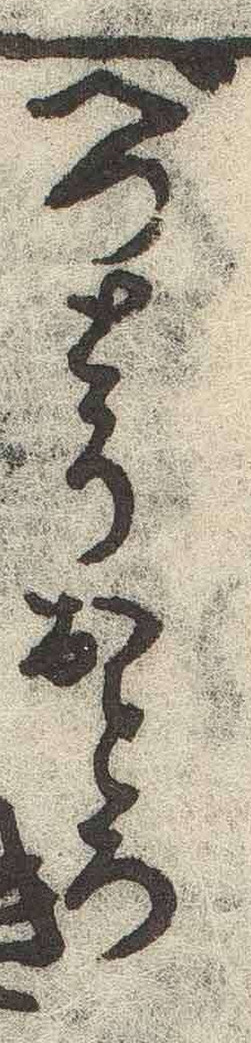べつとうおとろき
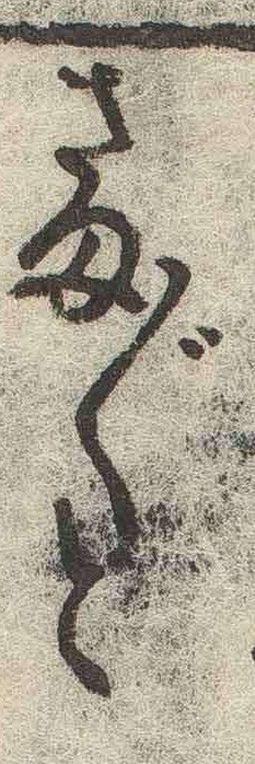さま〴〵と
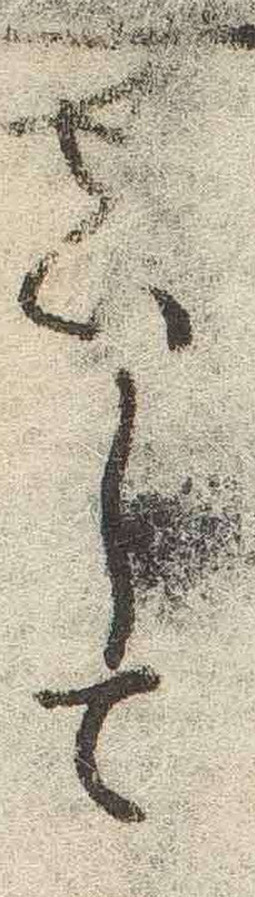せいして
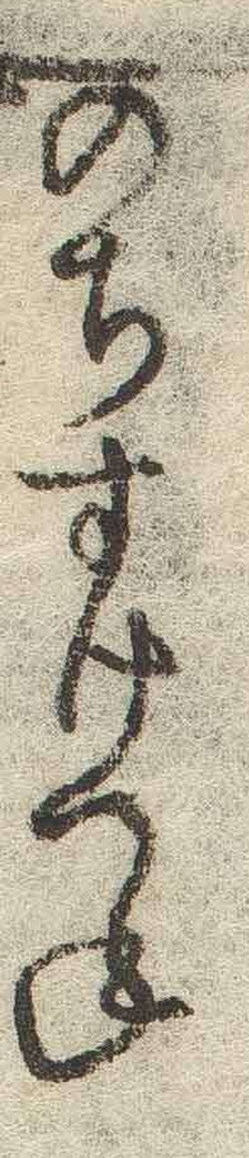のちすけつね
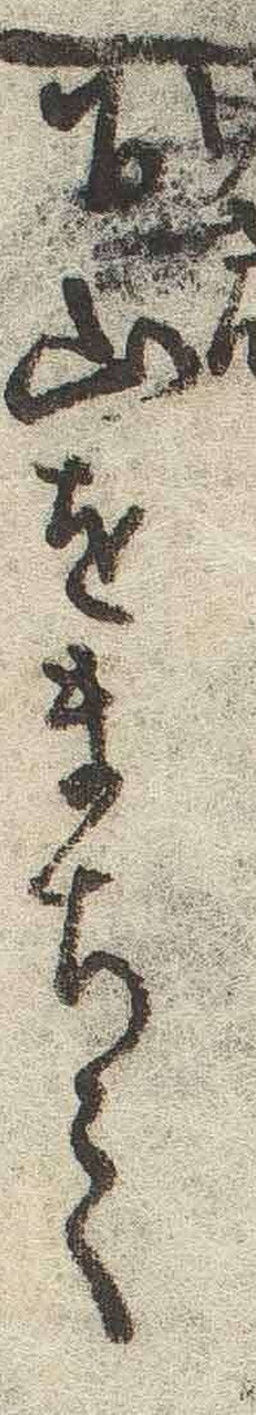下山をまちて
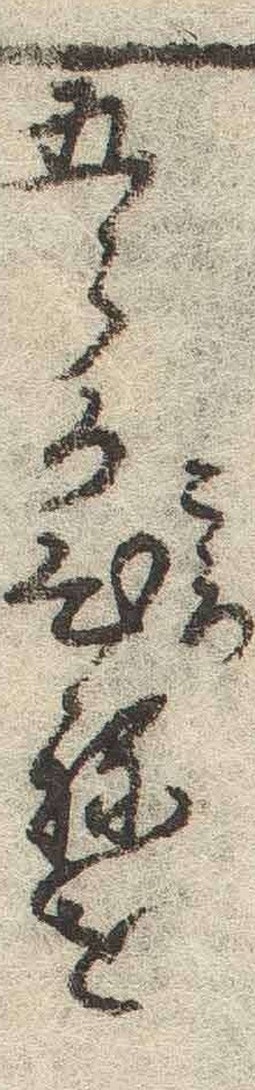五郎か心ねを
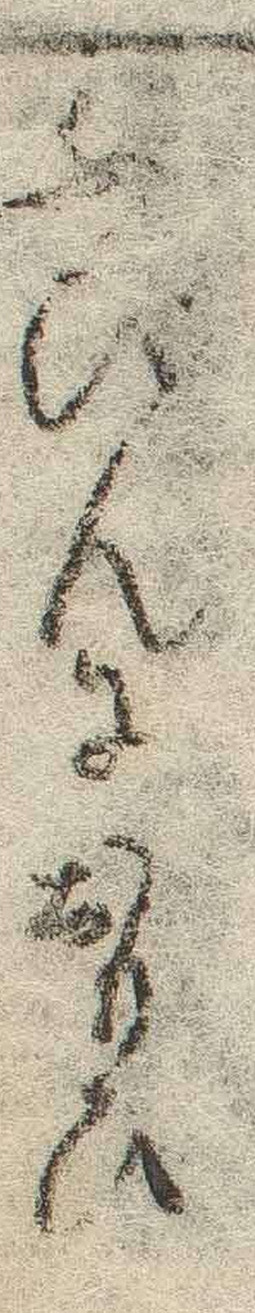ふびんにおもひ
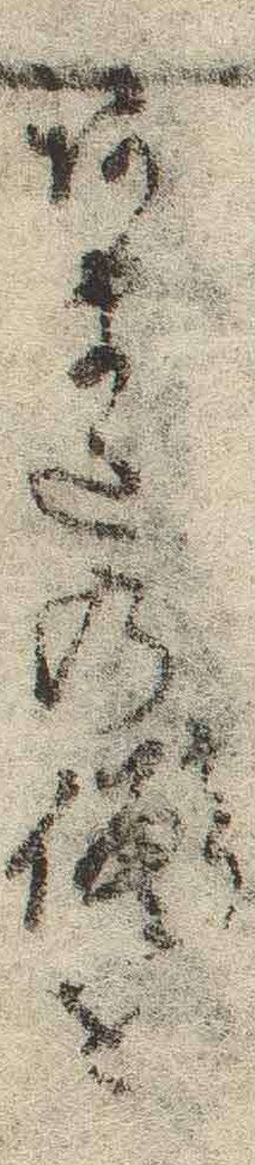あまたの僧を
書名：末広扇
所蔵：東京学芸大学附属図書館 国文学研究資料館
